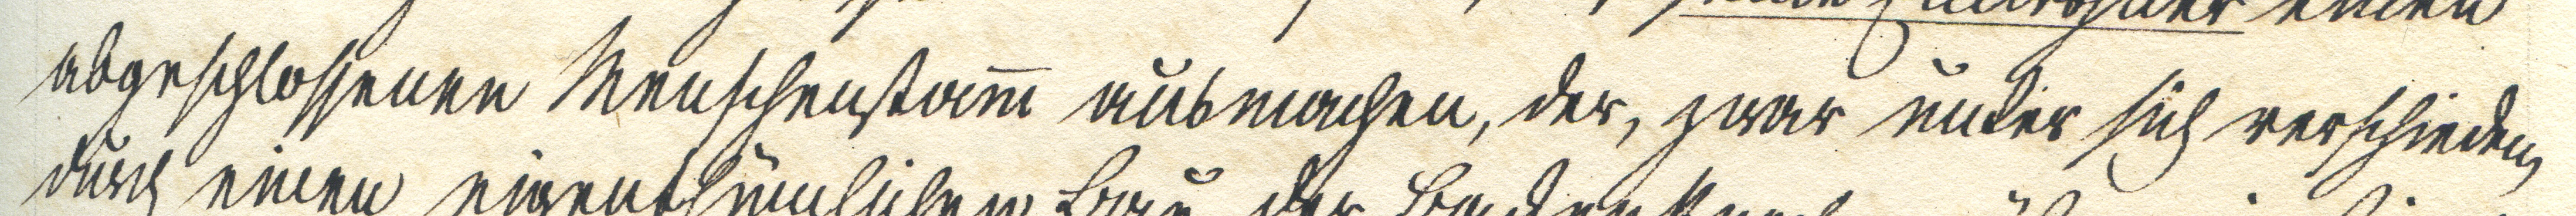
abgeschlossenen Menschenstam̃ ausmachen, der, zwar unter sich verschieden,
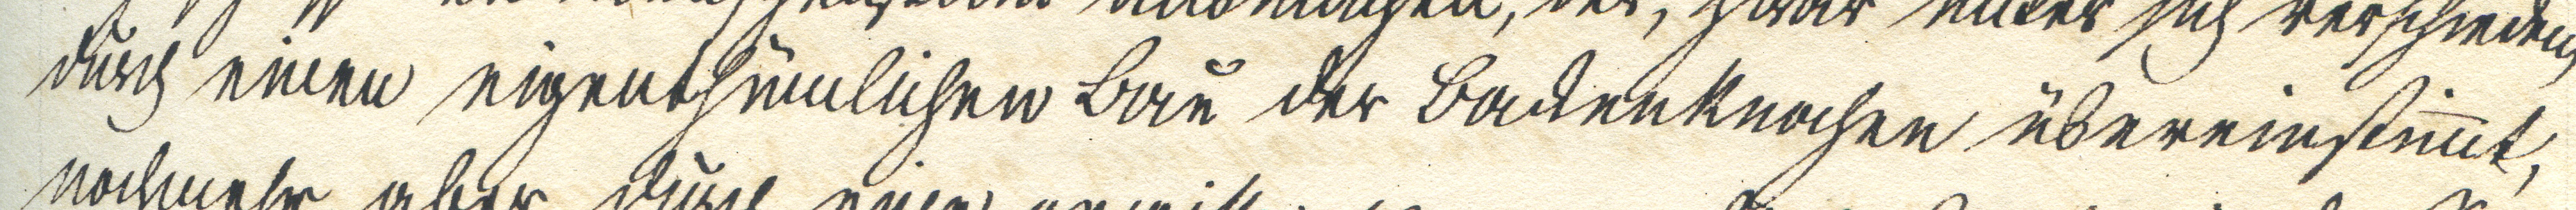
durch einen eigenthümlichen Bau der Backenknochen übereinstim̃t,
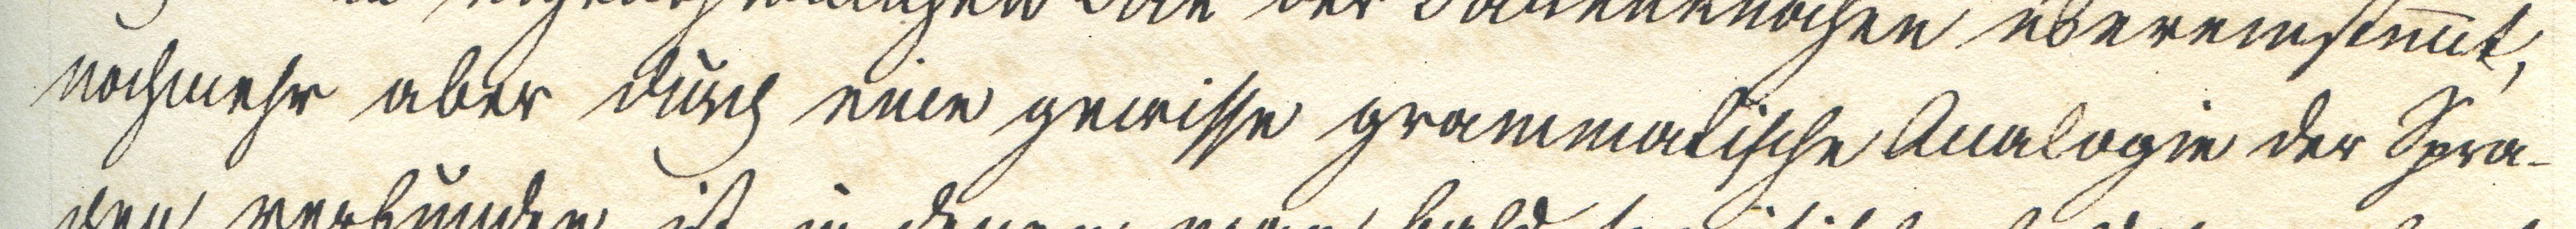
nochmehr aber durch eine gewisse grammatische Analogie der Spra-
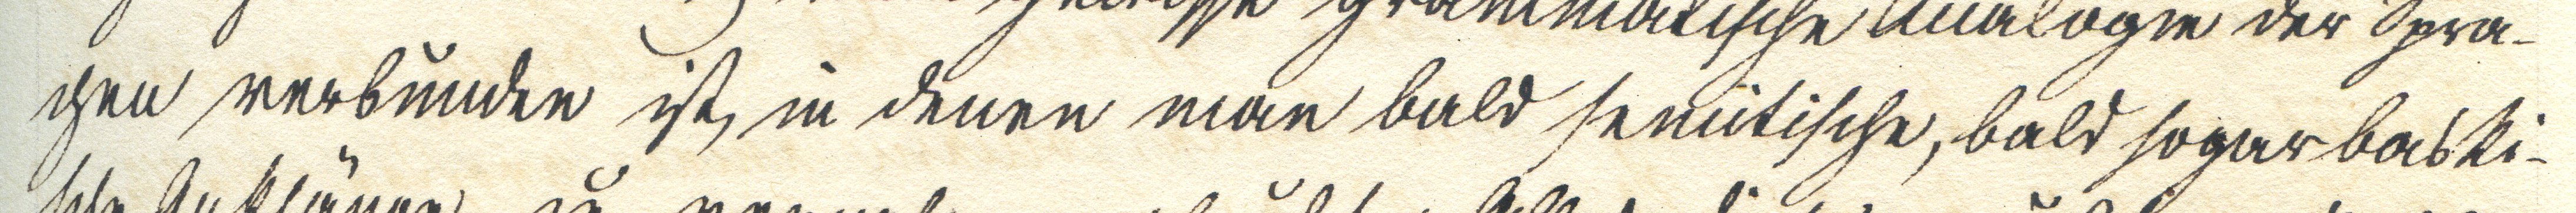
chen verbunden ist, in denen man bald semitische, bald sogar baski-
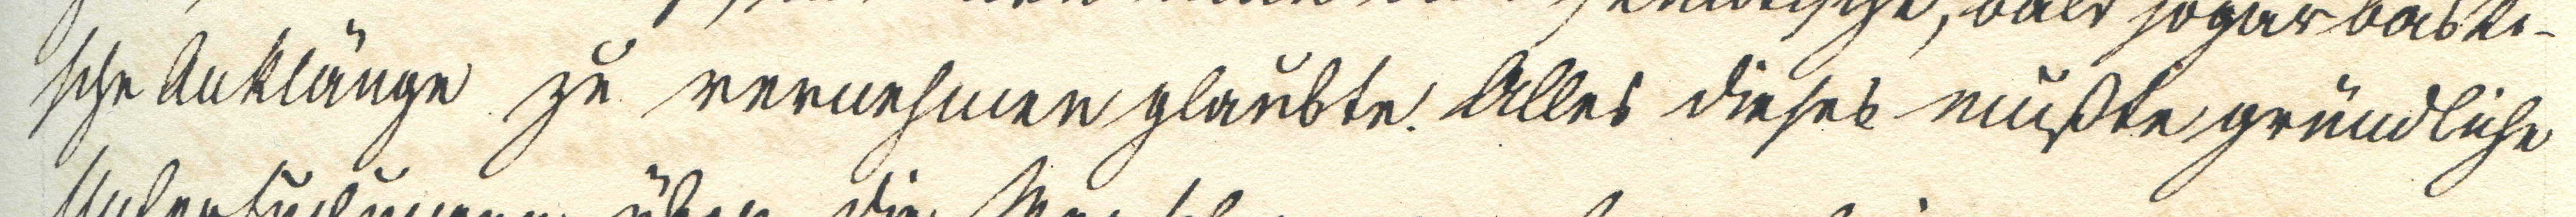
sche Anklänge zu vernehmen glaubte. Alles dieses mußte gründliche
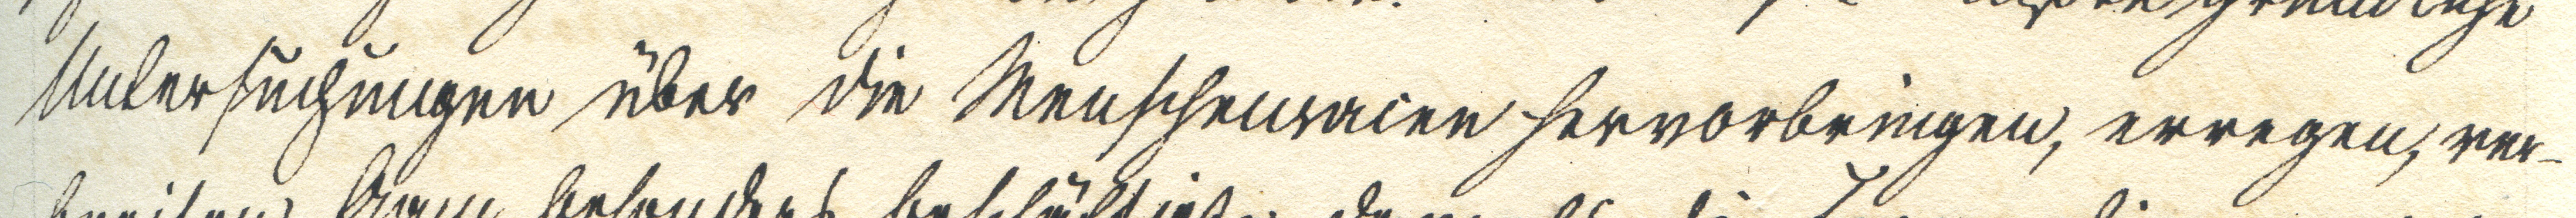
Untersuchungen über die Menschenracen hervorbringen, erregen, ver-
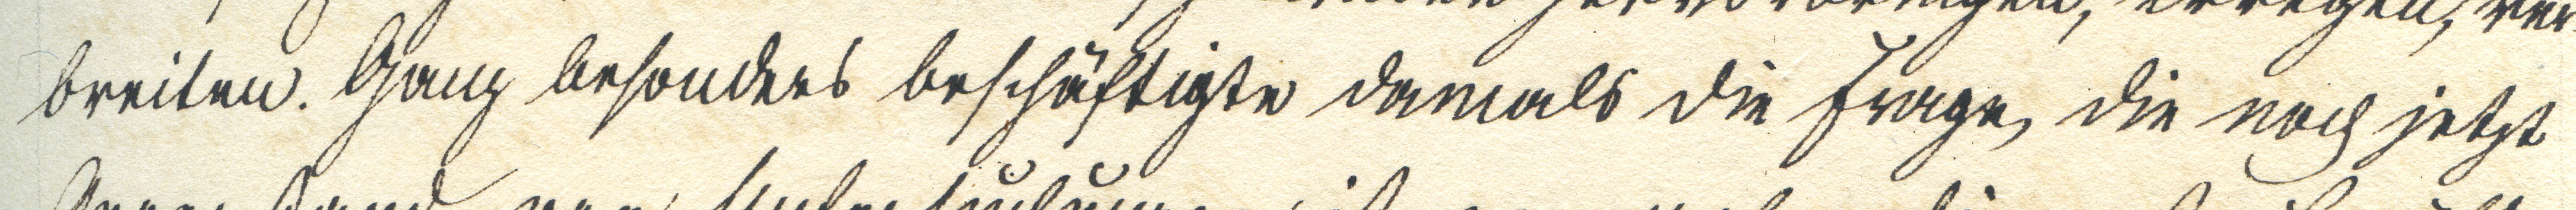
breiten. Ganz besonders beschäftigte damals die Frage, die noch jetzt
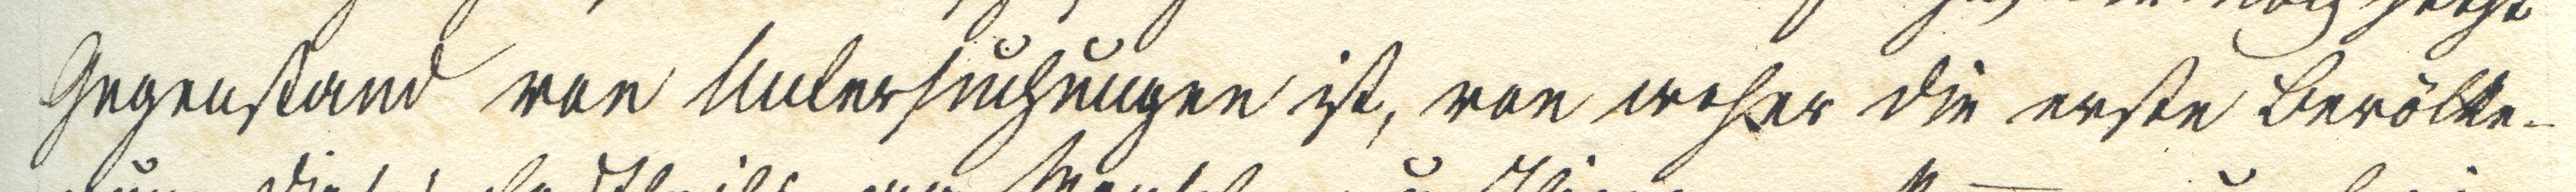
Gegenstand von Untersuchungen ist, von woher die erste Bevölke-
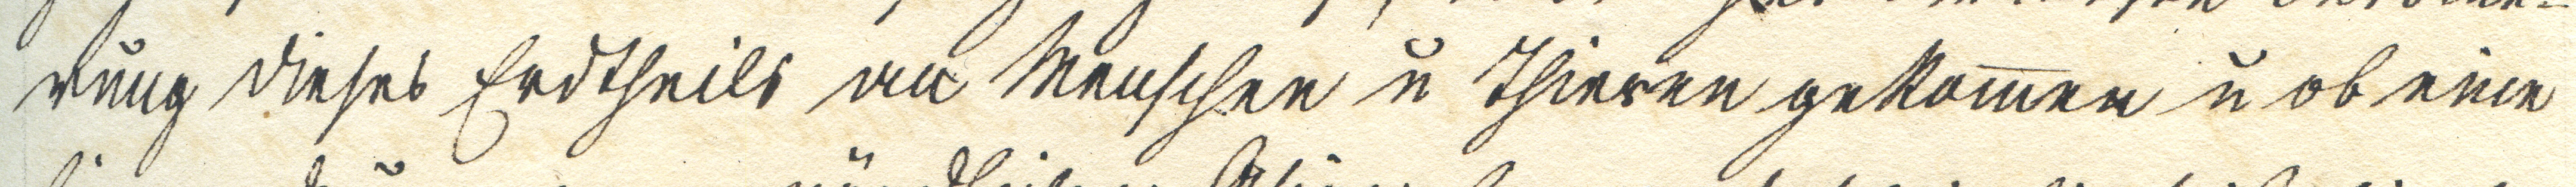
rung dieses Erdtheils an Menschen u Thieren gekom̃en u ob eine
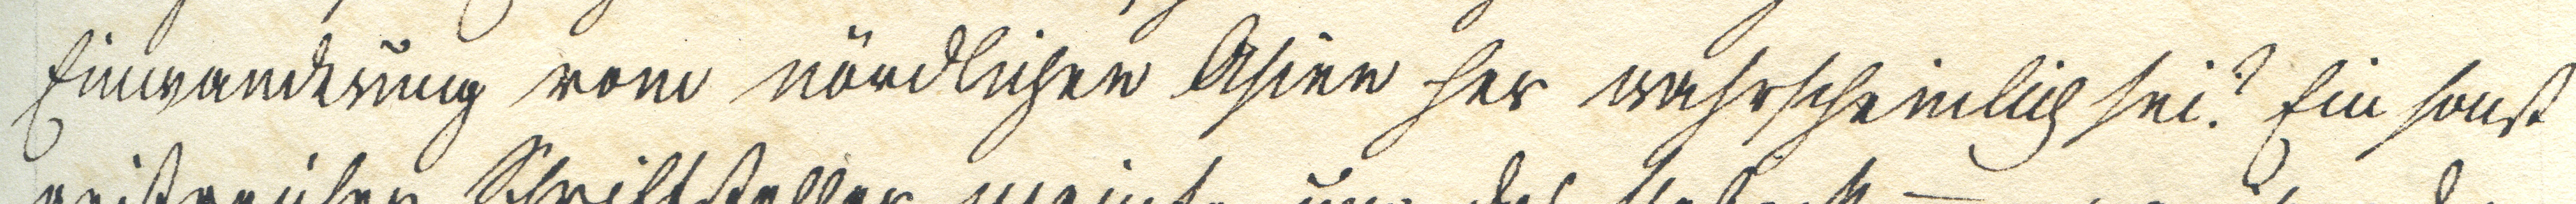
Einwanderung vom nördlichen Asien her wahrscheinlich sei? Ein sonst
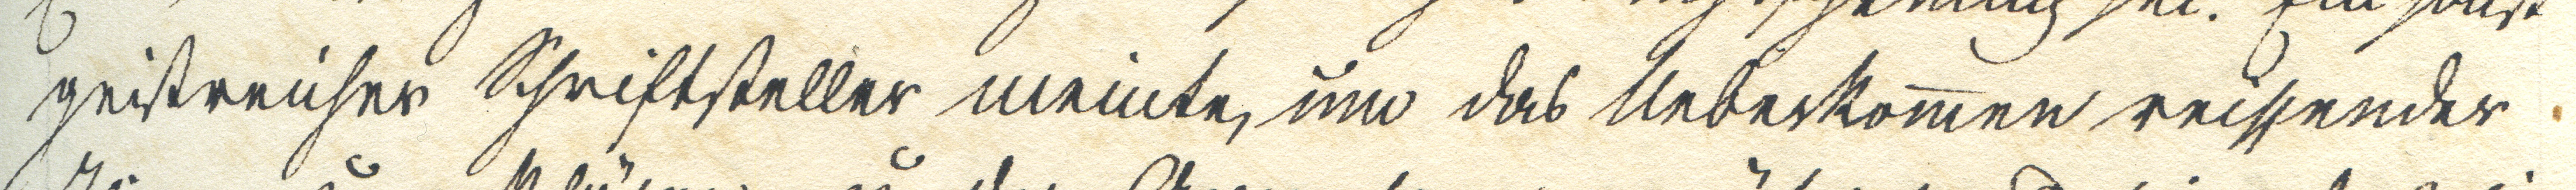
geistreicher Schriftsteller meinte, um das Ueberkom̃en reissender
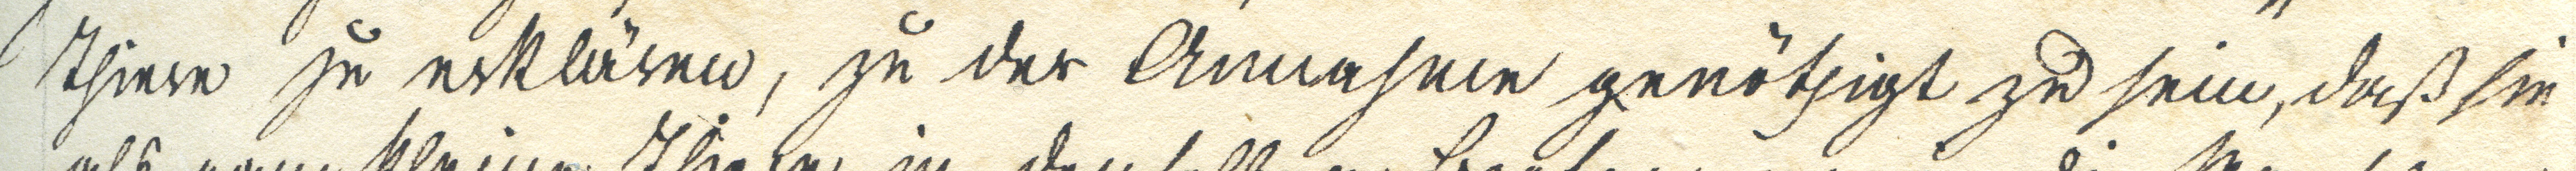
Thiere zu erklären, zu der Annahme genöthigt zu sein, daß sie
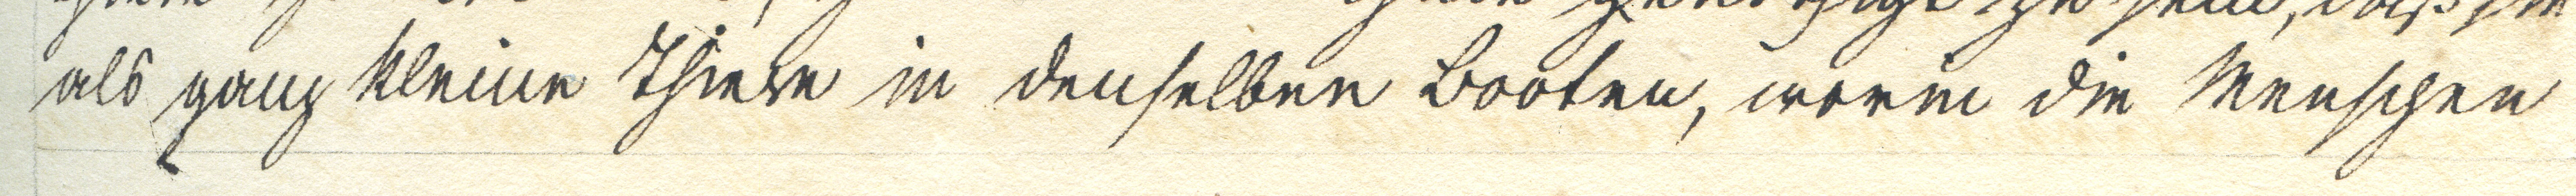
als ganz kleine Thiere in denselben Booten, worin die Menschen
